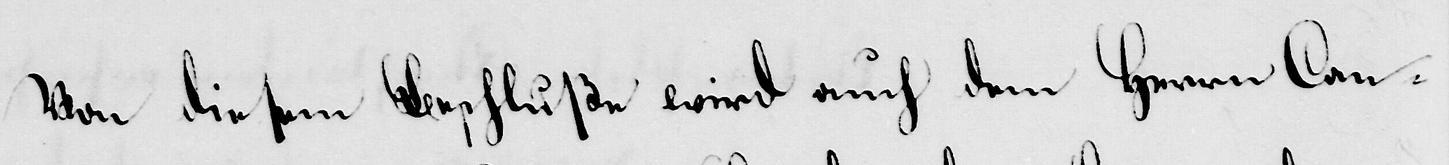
Von diesem Beschluße wird auch dem Herrn Can¬
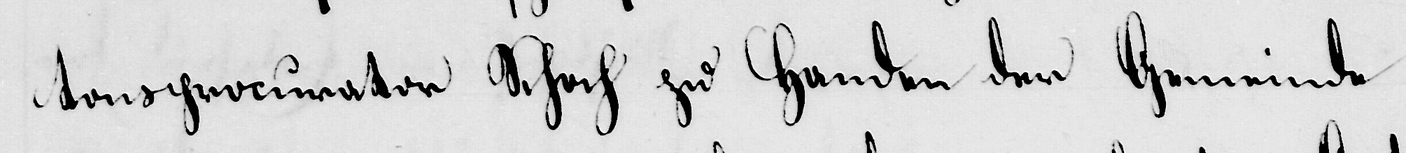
tonsprocurator Schoch zu Handen der Gemeinde
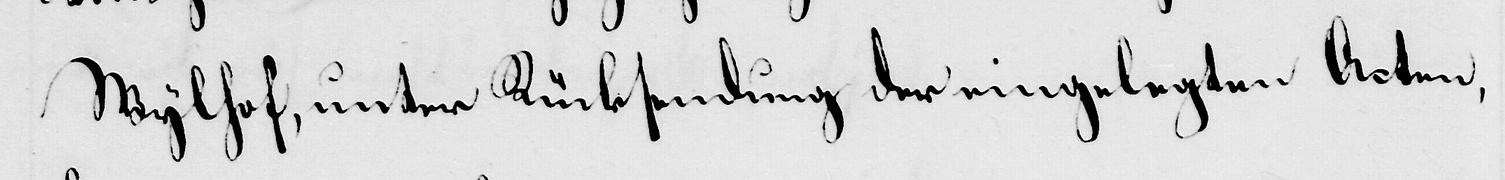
Wylhof, unter Rücksendung der eingelegten Acten,
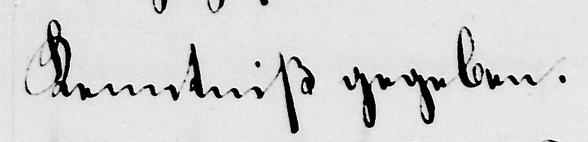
Kenntniß gegeben.
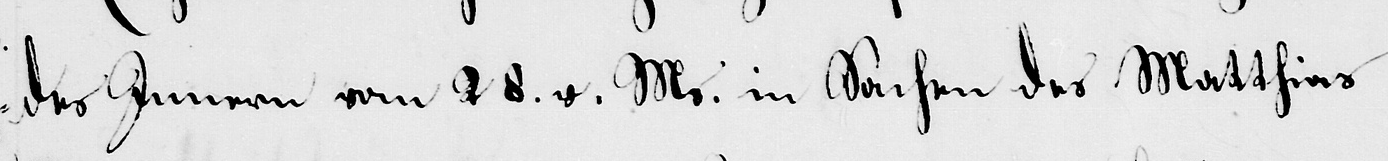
des Innern vom 28. v. Ms. in Sachen des Matthias
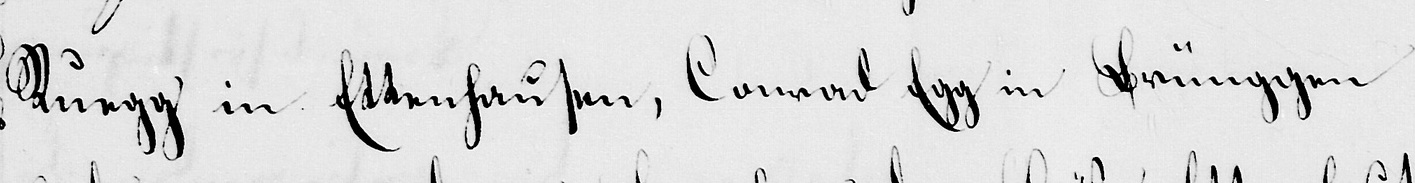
Ruegg in Ettenhausen, Conrad Egg in Brünggen
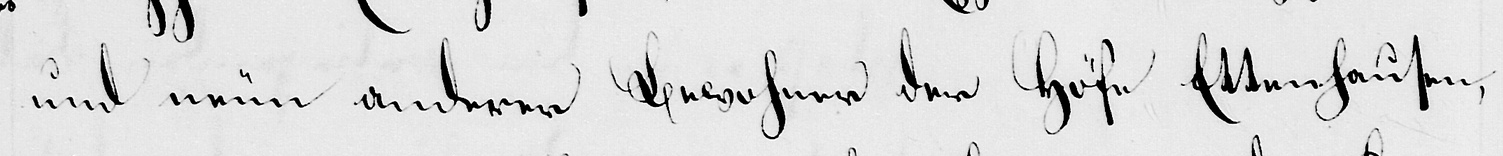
und neun anderer Bewohner der Höfe Ettenhausen,
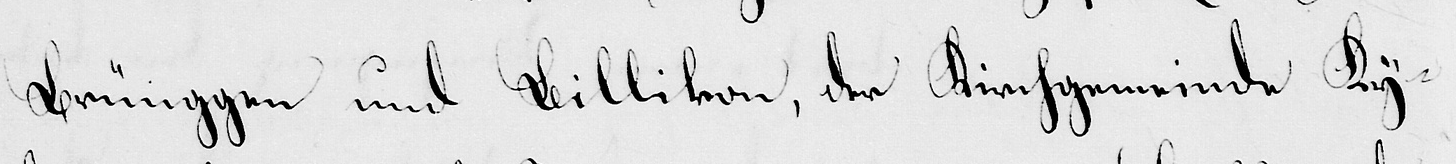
Brünggen und Billikon, der Kirchgemeinde Ky¬
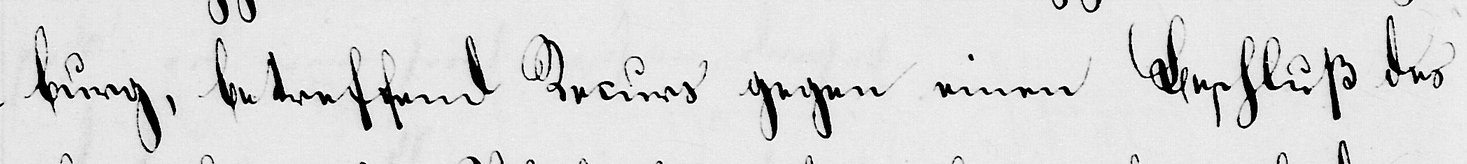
burg, betreffend Recurs gegen einen Beschluß des
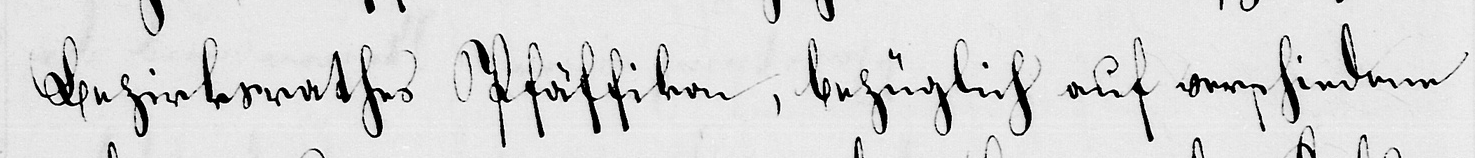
Bezirksrathes Pfäffikon, bezüglich auf verschiedene
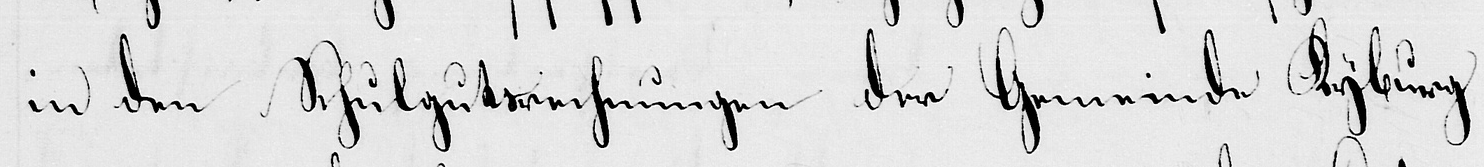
in den Schulgutsrechnungen der Gemeinde Kyburg
